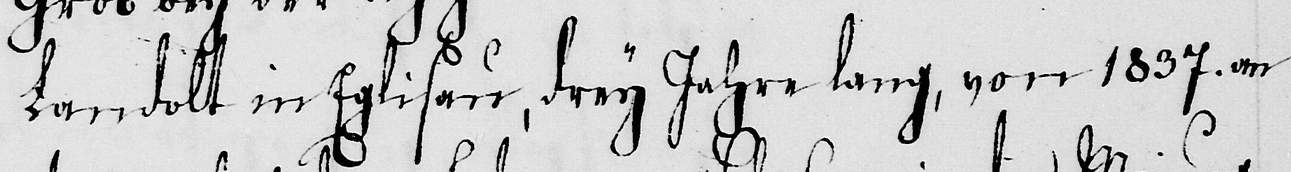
Landolt in Eglisau, drey Jahre lang, von 1837. an
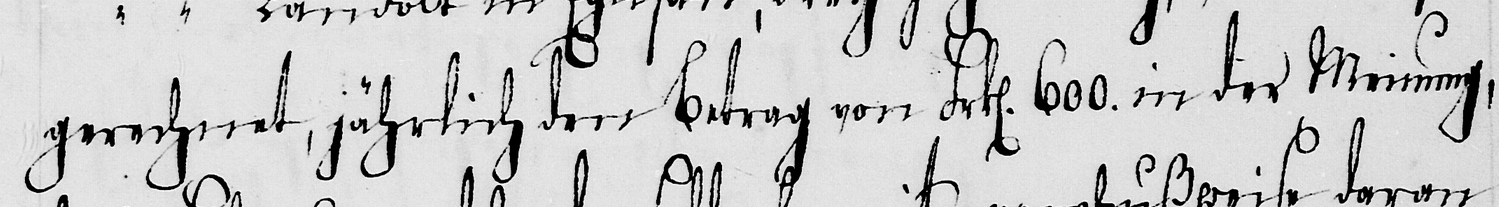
gerechnet, jährlich den Betrag von Frk[en]. 600. in der Meinung,
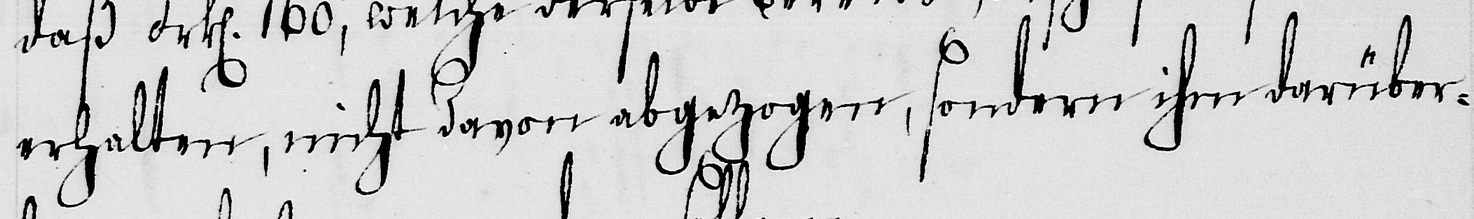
erhalten, nicht davon abgezogen, sondern ihm darüber¬
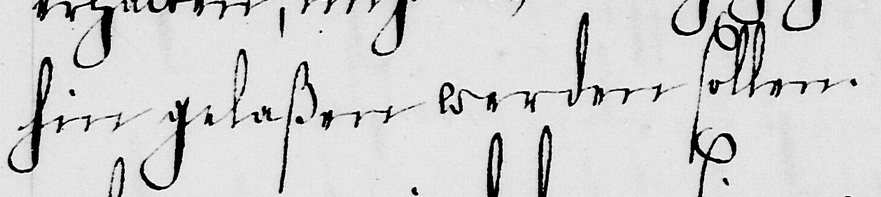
hin gelaßen werden sollen.
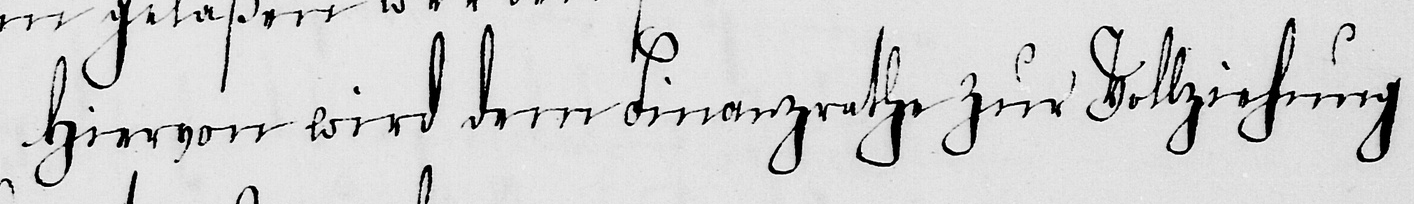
Hiervon wird dem Finanzrathe zur Vollziehung
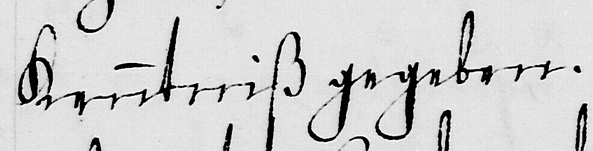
Kenntniß gegeben.
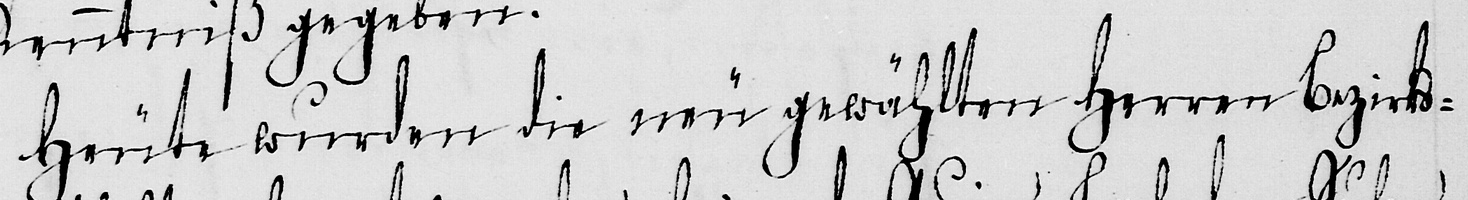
Heute wurden die neu gewählten Herren Bezirk¬
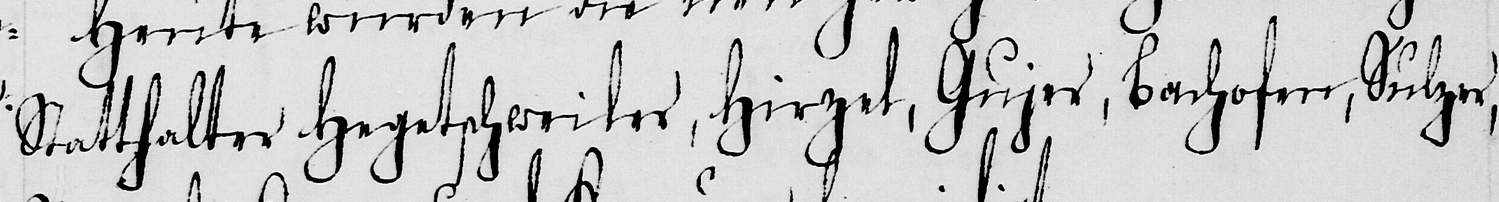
tatthalter Hegetschweiler, Hirzel, Gujer, Bachofen, Sulzer,
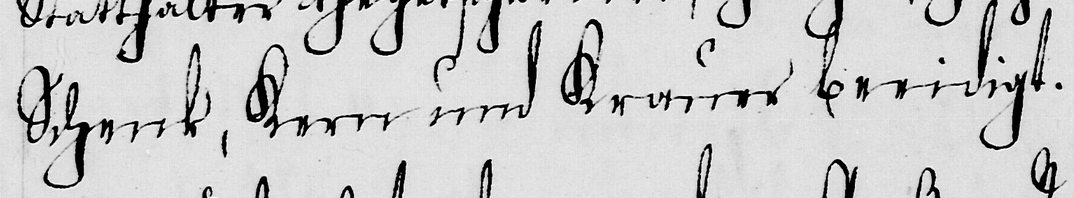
Schenk, Kern und Krauer beeidigt.
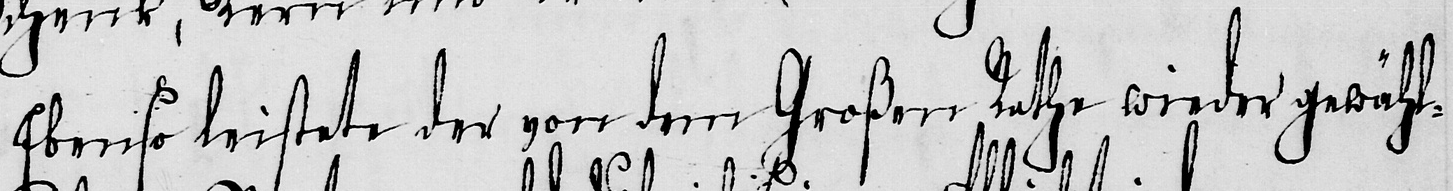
Ebenso leistet der von dem Großen Rathe wieder gewähl¬
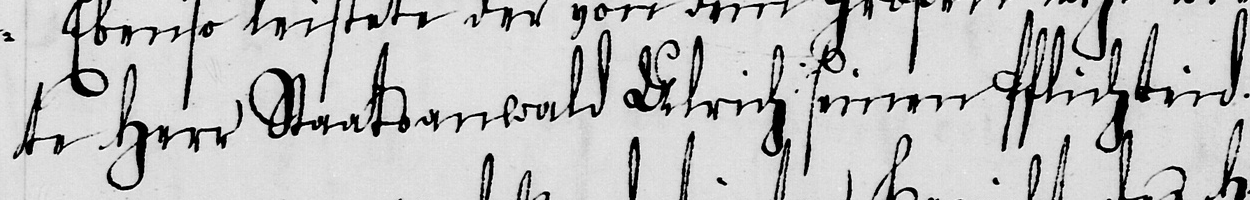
te Herr Staatsanwald Ulrich seinen Pflichteid.
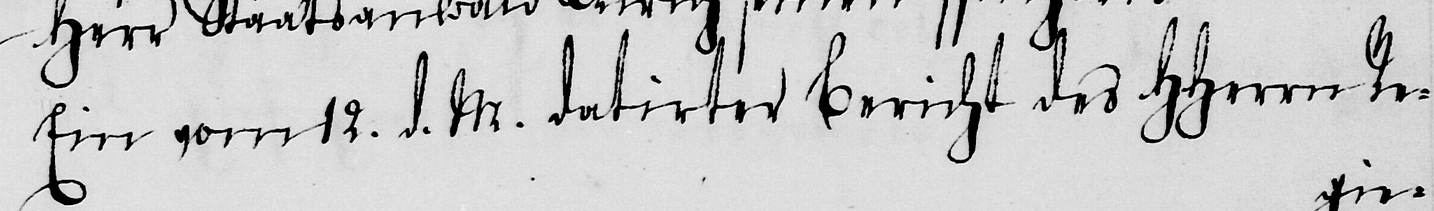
Ein vom 12. d. M. datirter Bericht des HHerrn Re-
